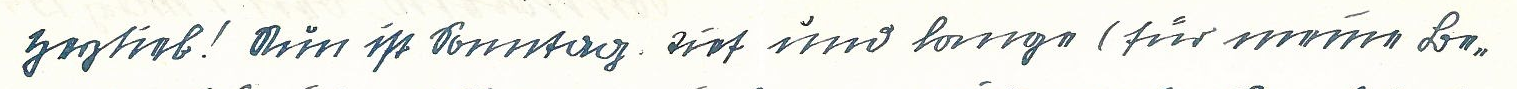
Herzlieb! nun ist Sonntag. Tief und lange (für meine Be¬
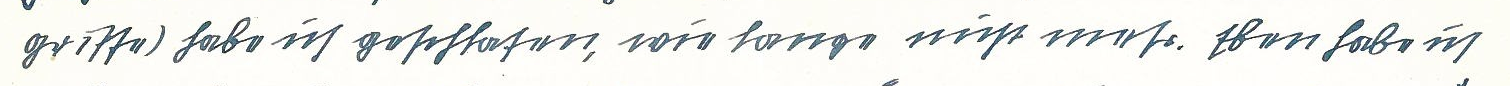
griffe) habe ich geschlafen, wie lange nicht mehr. Eben habe ich
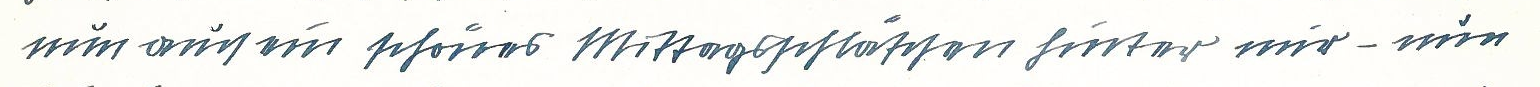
nun auch ein schönes Mittagsschläfchen hinter mir – nun
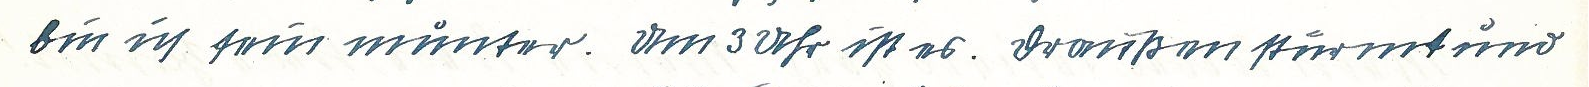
bin ich fein munter. Um 3 Uhr ist es. Draußen stürmt und
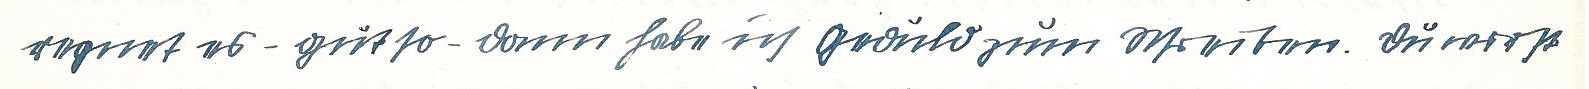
regnet es – gut so – dann habe ich Geduld zum Schreiben. Du wirst
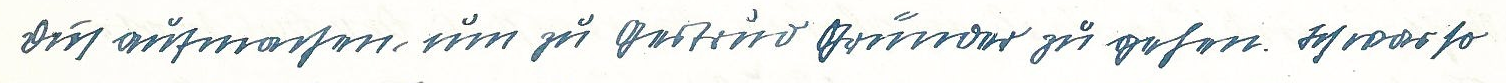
Dich aufmachen, um zu Gertrud G. zu gehen. Ich war so
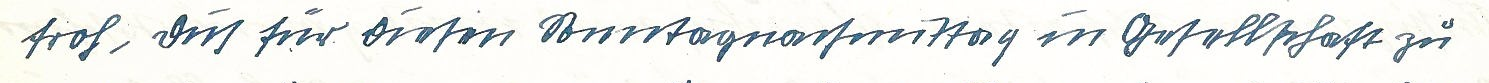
froh, Dich für diesen Sonntagnachmittag in Gesellschaft zu
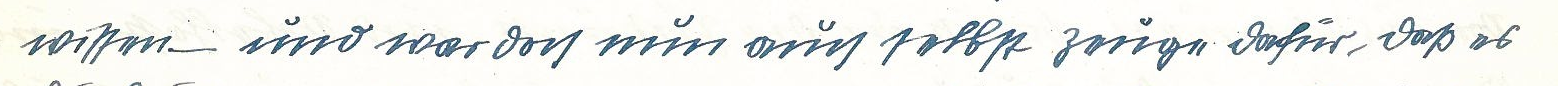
wissen – und war doch nun auch selbst Zeuge dafür, daß es
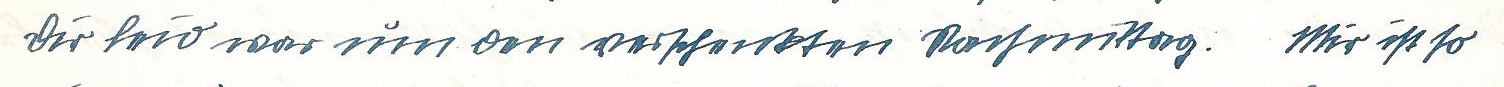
Dir leid war um den verschenkten Nachmittag. Mir ist so
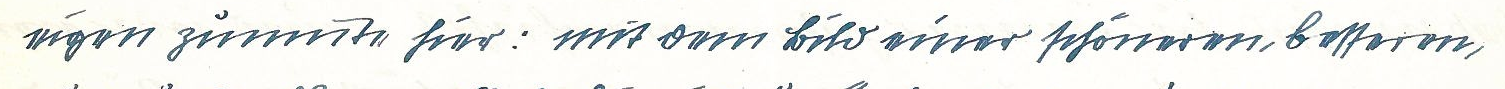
eigen zumute hier: mit dem Bild einer schöneren, besseren,
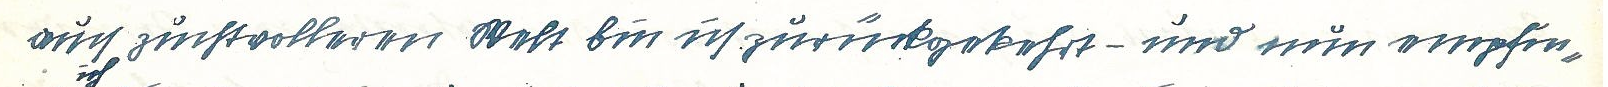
und auch zuchtvolleren Welt bin ich zurückgekehrt – und nun empfin¬
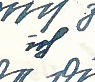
ich
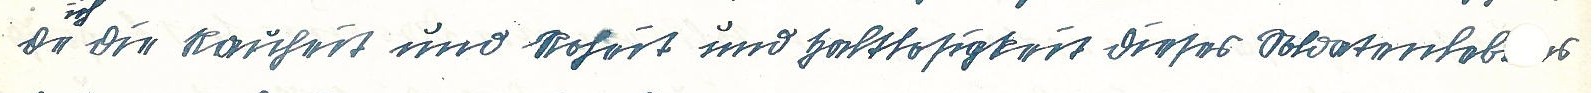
de die Rauheit und Rohheit und Haltlosigkeit dieses Soldatenlebs
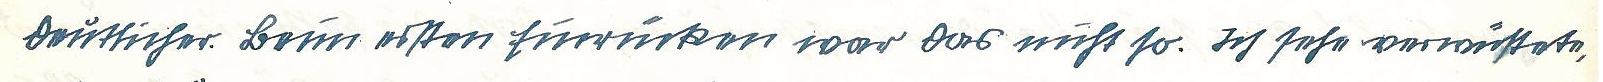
deutlicher. Beim ersten Einrücken war das nicht so. Ich sehe verwüstete,
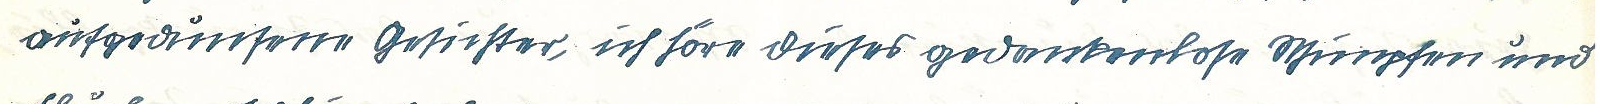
aufgedunsene Gesichter, ich höre dieses gedankenlose Schimpfen und
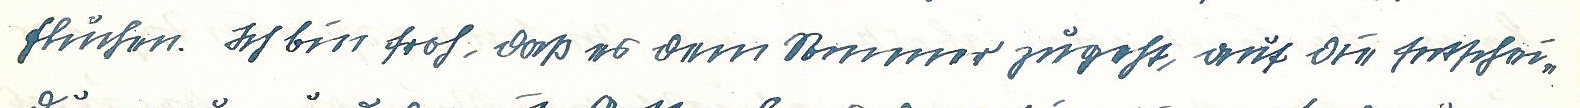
Fluchen. Ich bin froh, daß es dem Sommer zugeht, auf die Entschei¬
